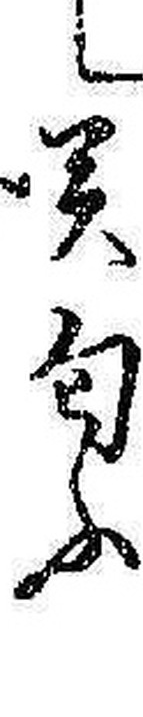咲匂ふ
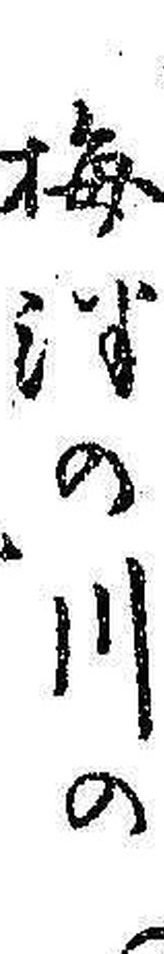梅津の川の
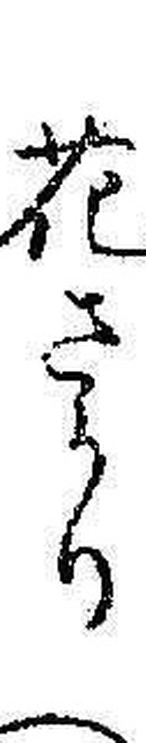花さかり
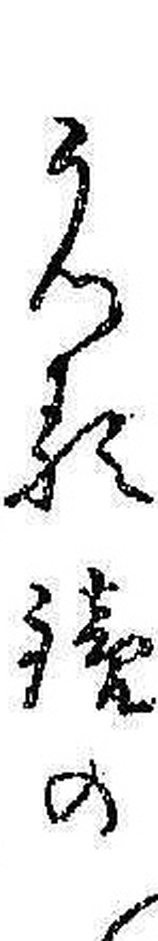うつる鏡の
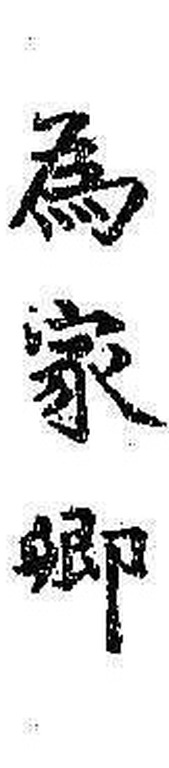為家卿
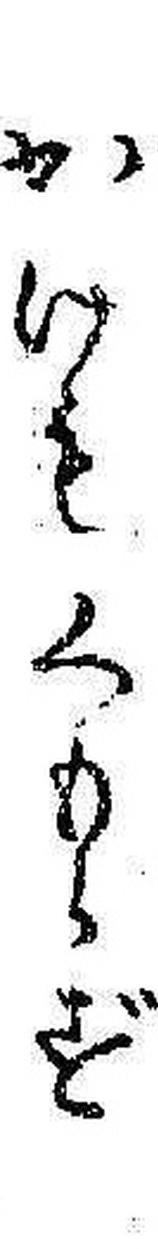かけもくもらず

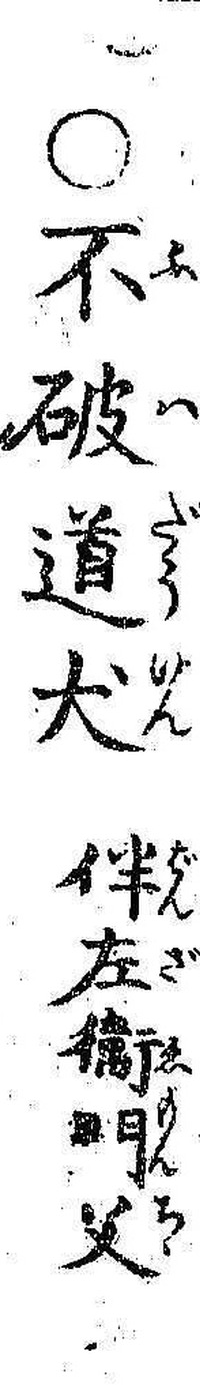○不破道犬伴左衛門父
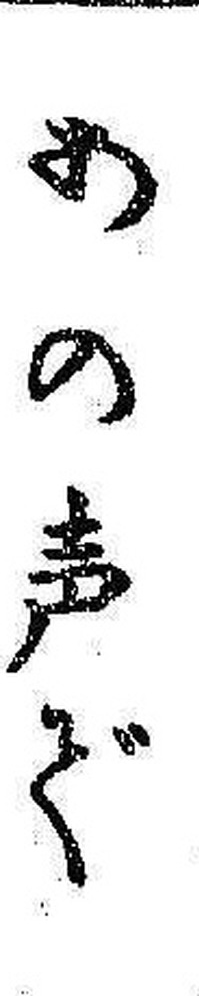あの声で
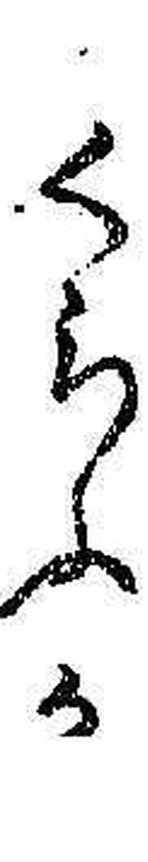くらふか
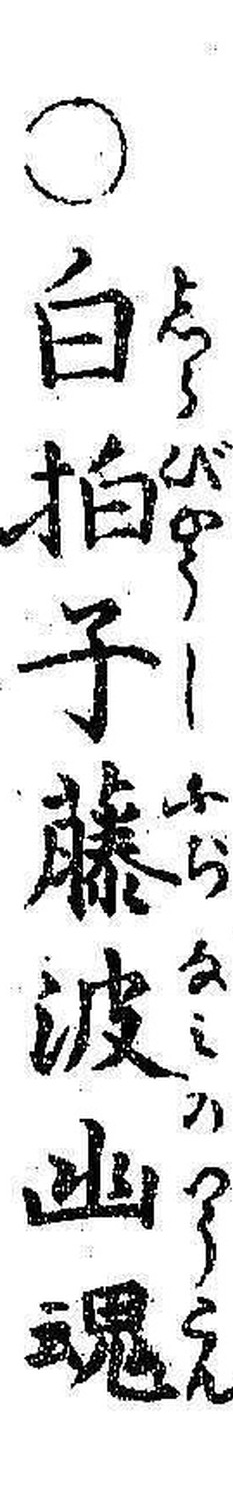○白拍子藤波幽魂
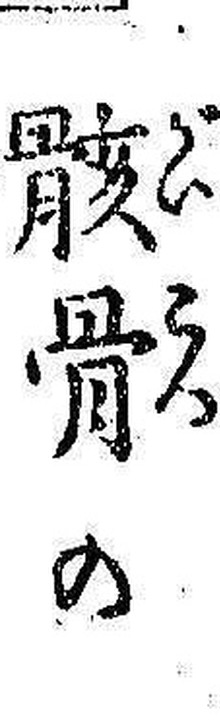骸骨の
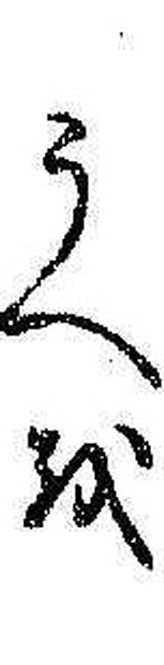うへを
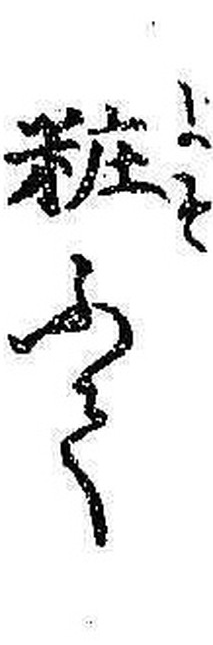粧ふて
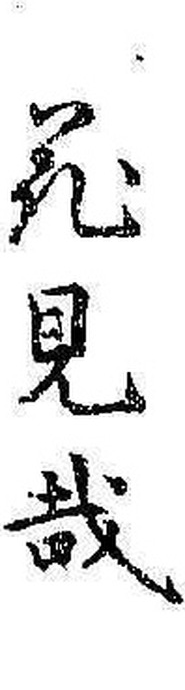花見哉
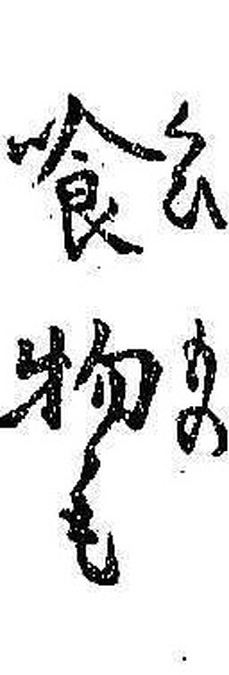喰物も
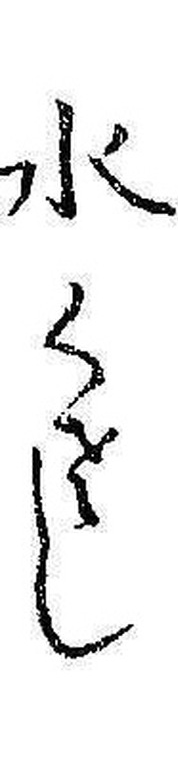水くさし
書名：昔話稲妻表紙
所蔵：国文学研究資料館
